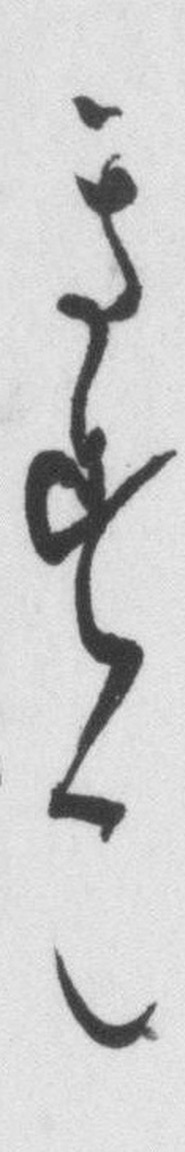きすこ
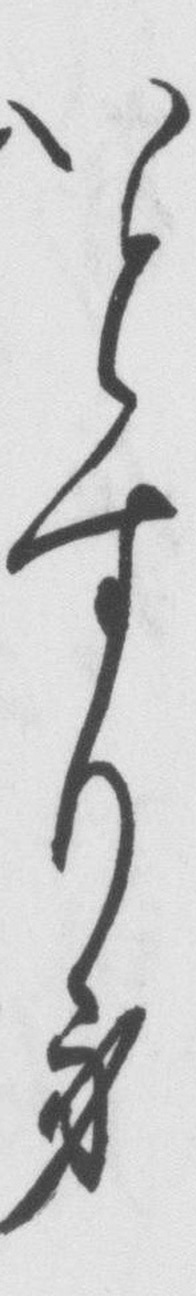いとすり身
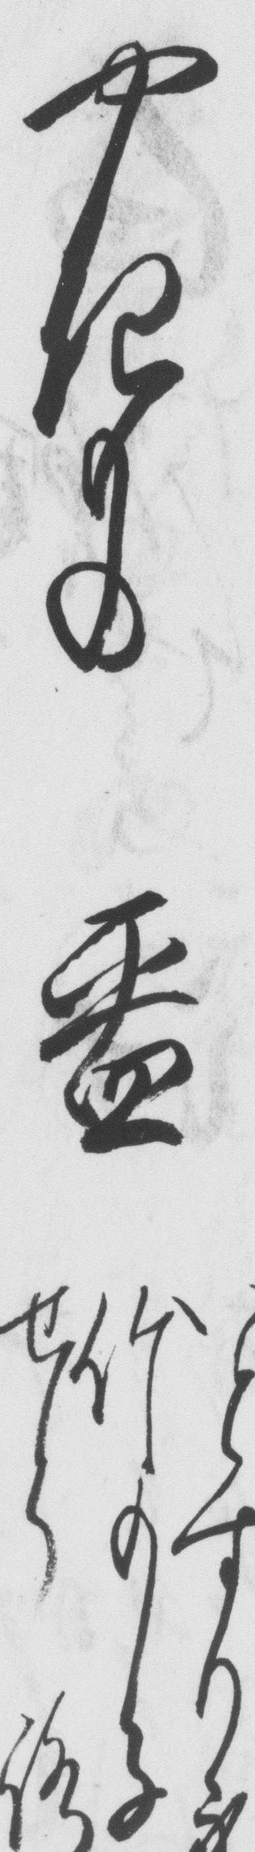やきもの平皿竹の子
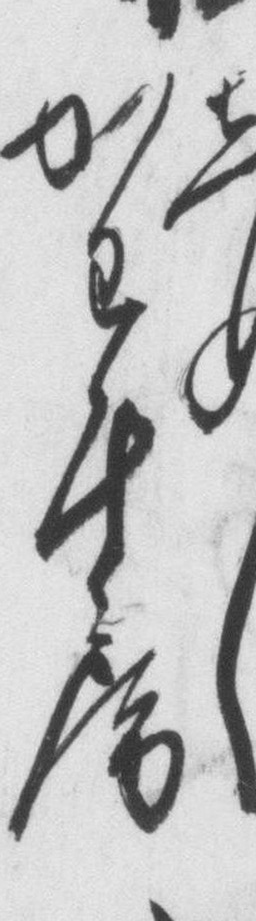かわ午房

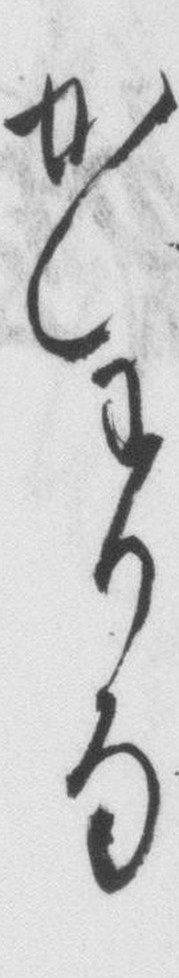かいわりな
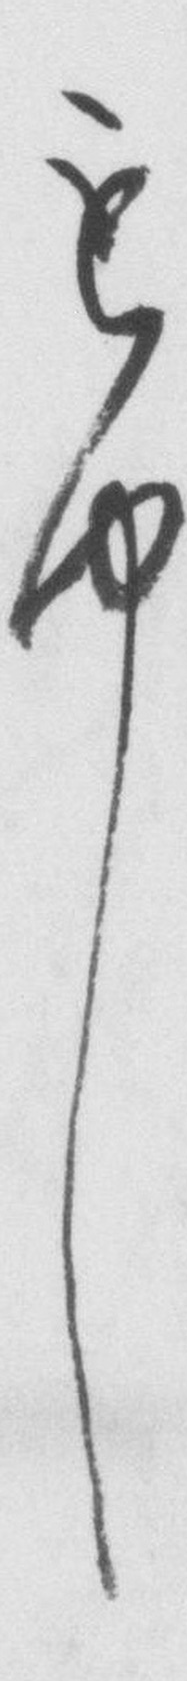もやし
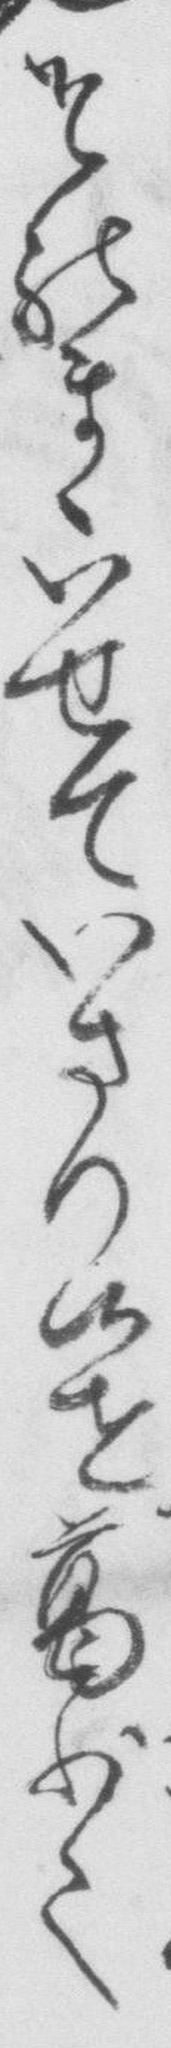そのまゝいせていさりを葛にて
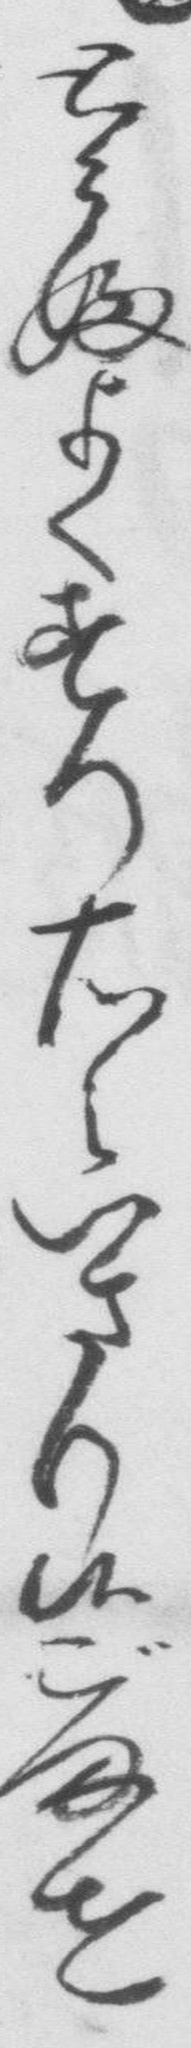とうふよくすり右いいさりごまを
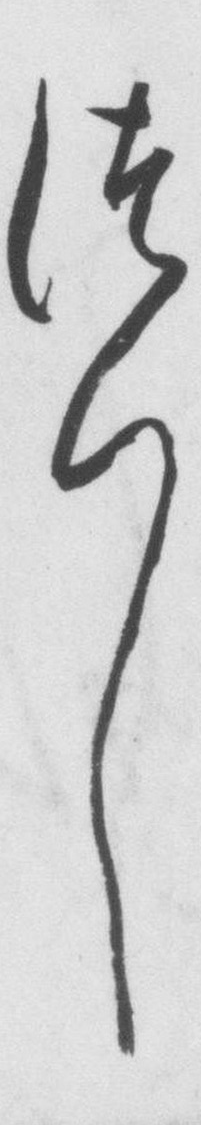つくし

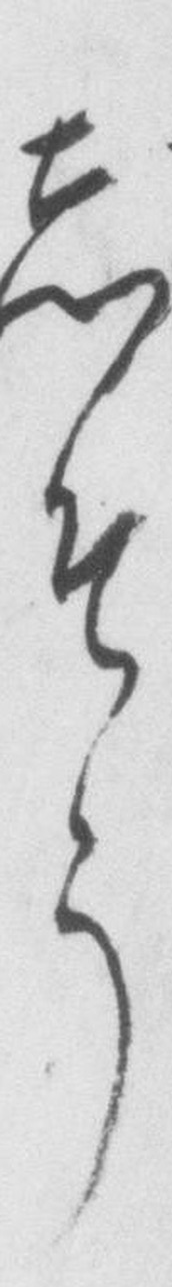ゑそう
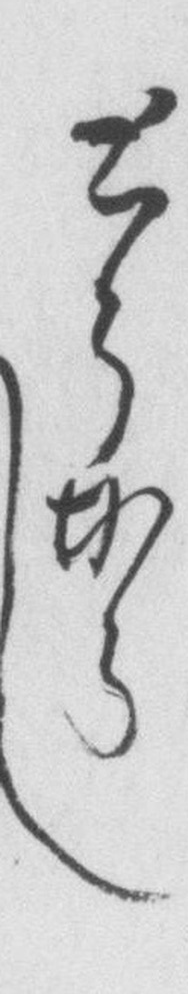とうからし
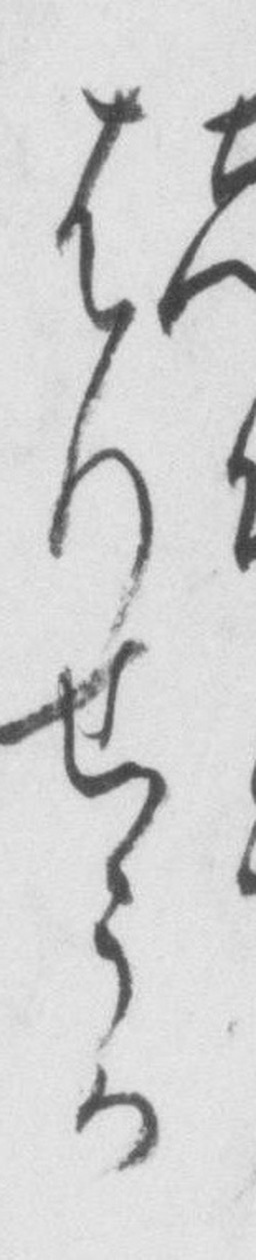はりせうが
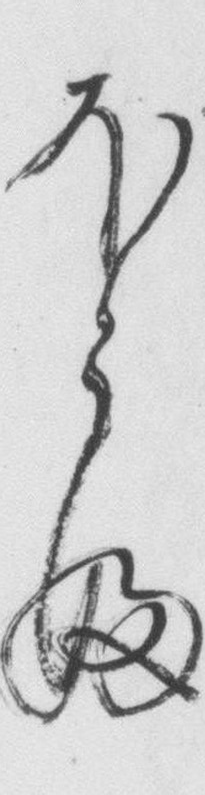ほうふ
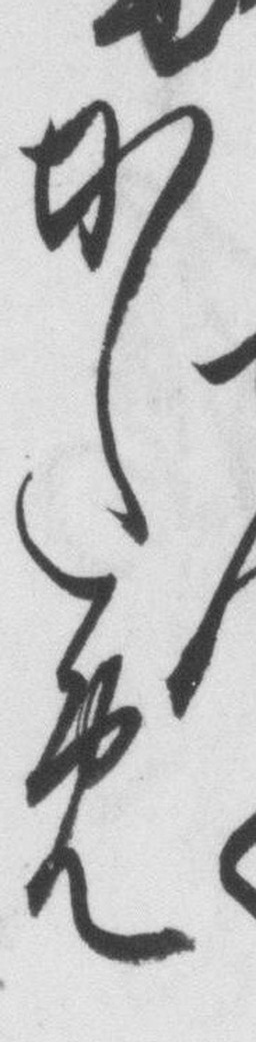かため

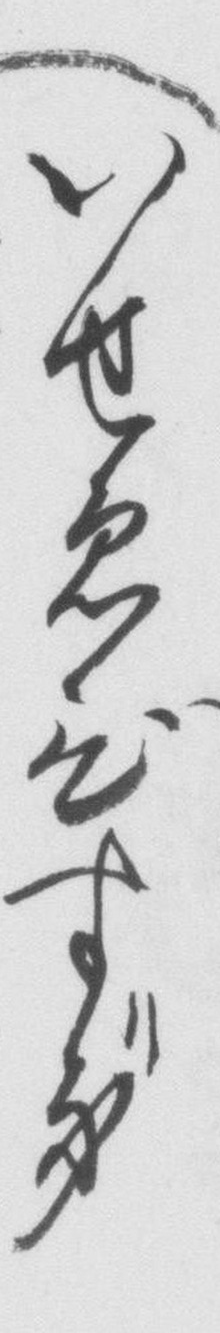いせゑひすり
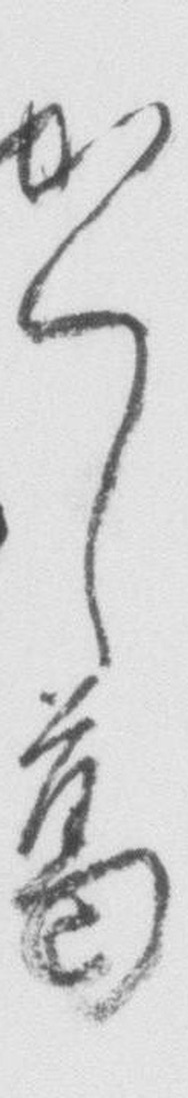かくし葛
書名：料理筌
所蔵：大阪府立大学学術情報センター 国文学研究資料館
